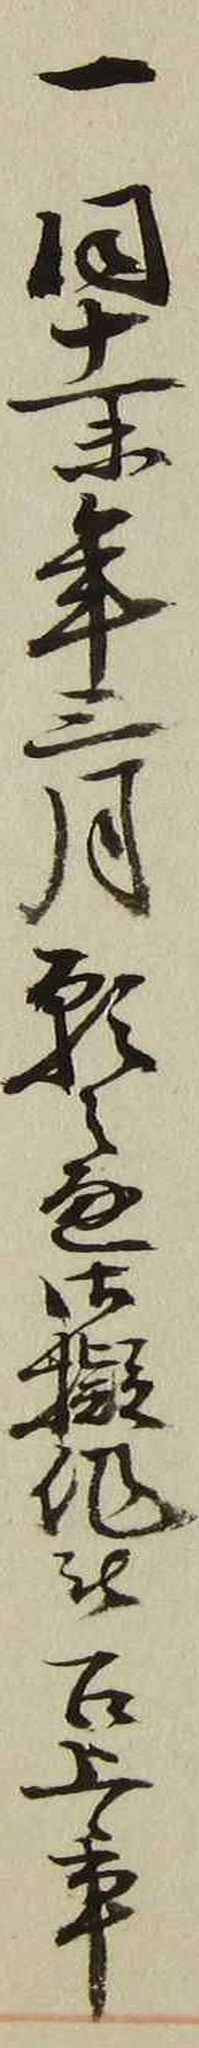一同十一未年三月願之通御擬作被召上候事
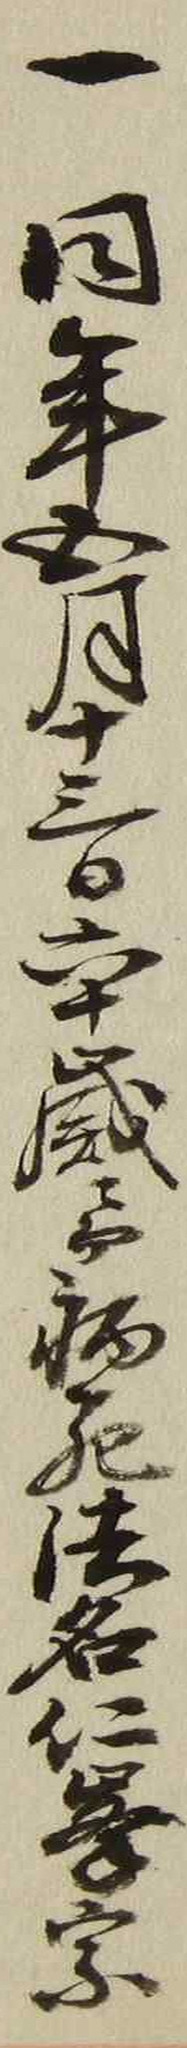一同年五月十三日六十歳に而病死法名仁峯宗
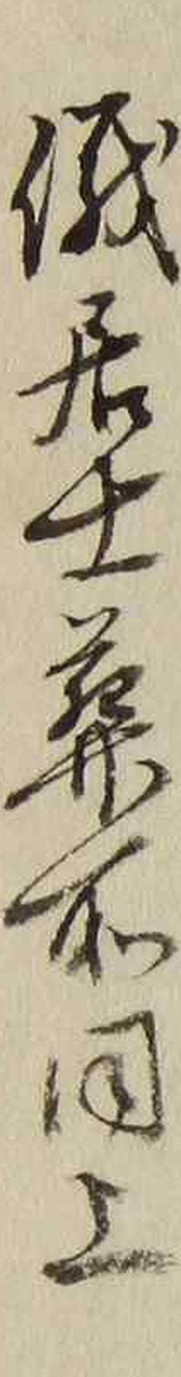儀居士葬所同上

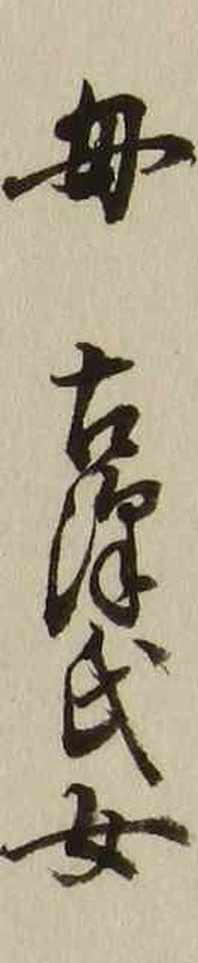母古沢氏女
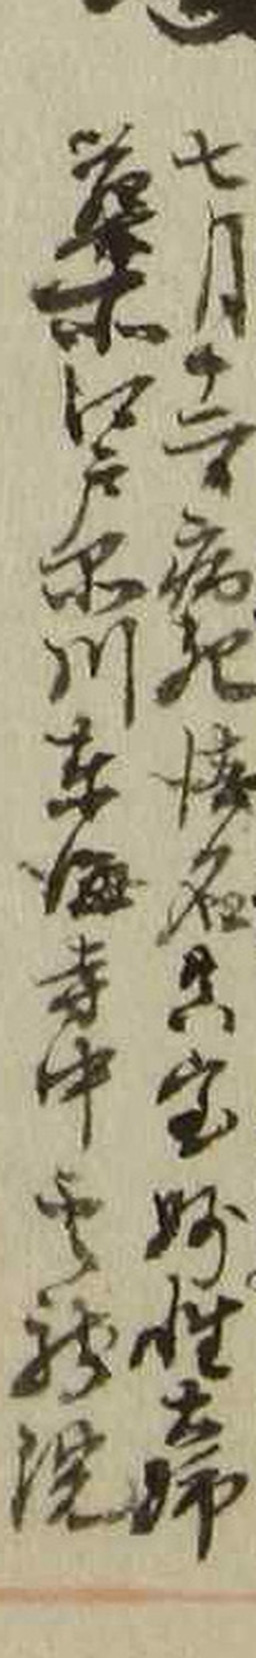葬所江戸品川東海寺中雲龍院
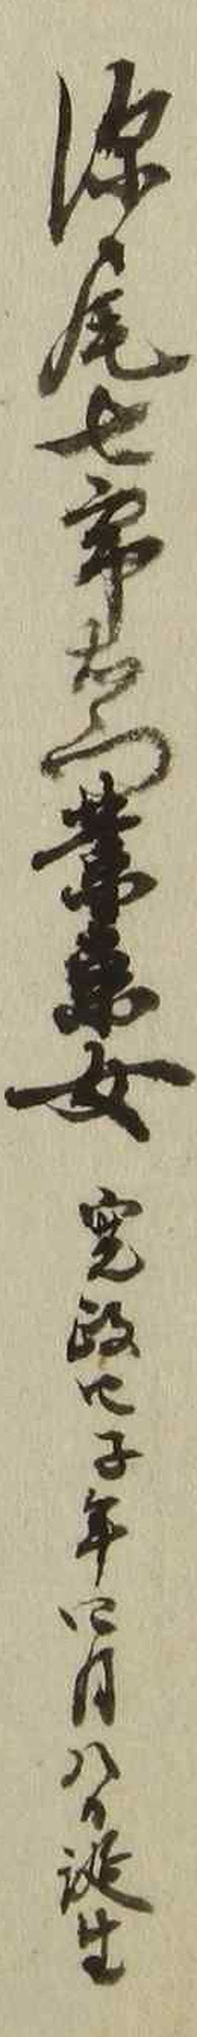源尾七郎右衛門業東女寛政四子年四月八日誕生
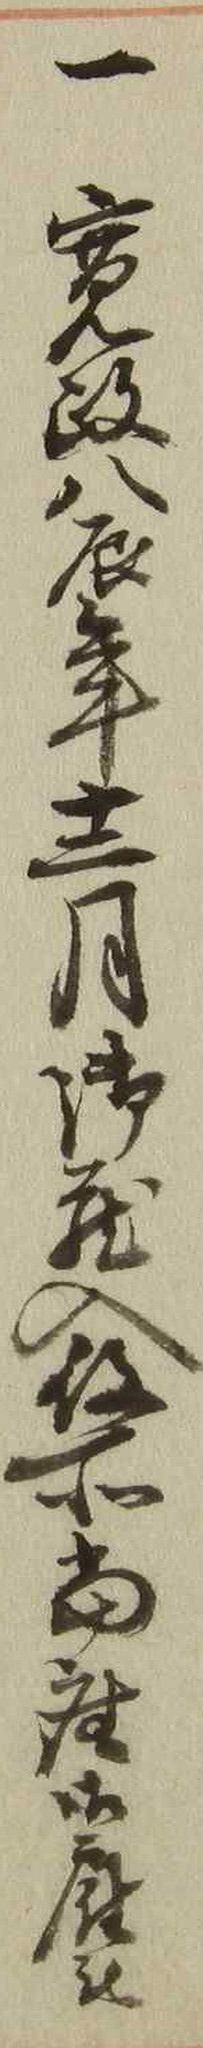一寛政八辰年十二月御蔵入役所当座御雇被
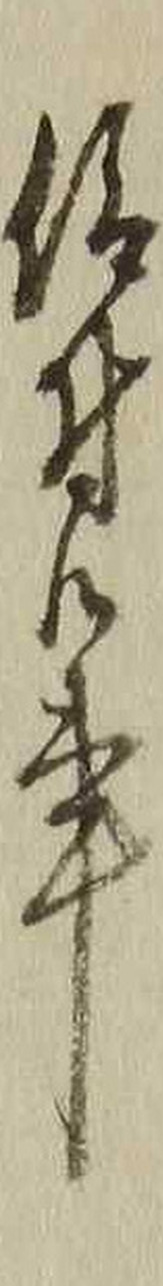仰付候事
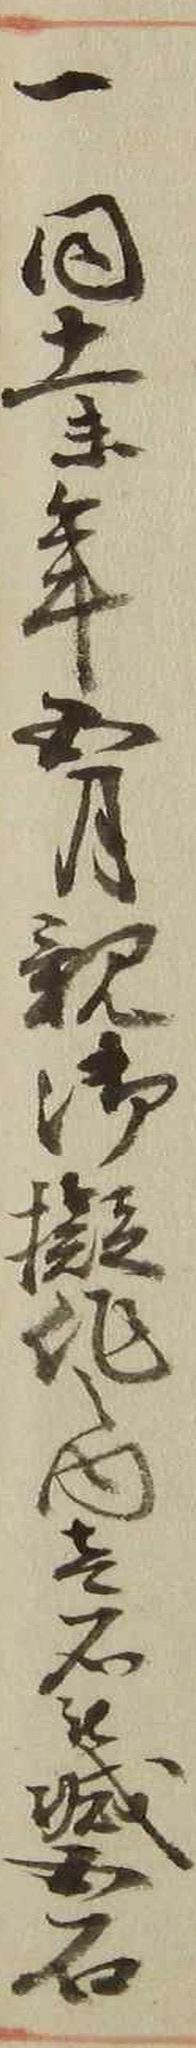一同十一未年五月親御擬作之内壱石被減五石
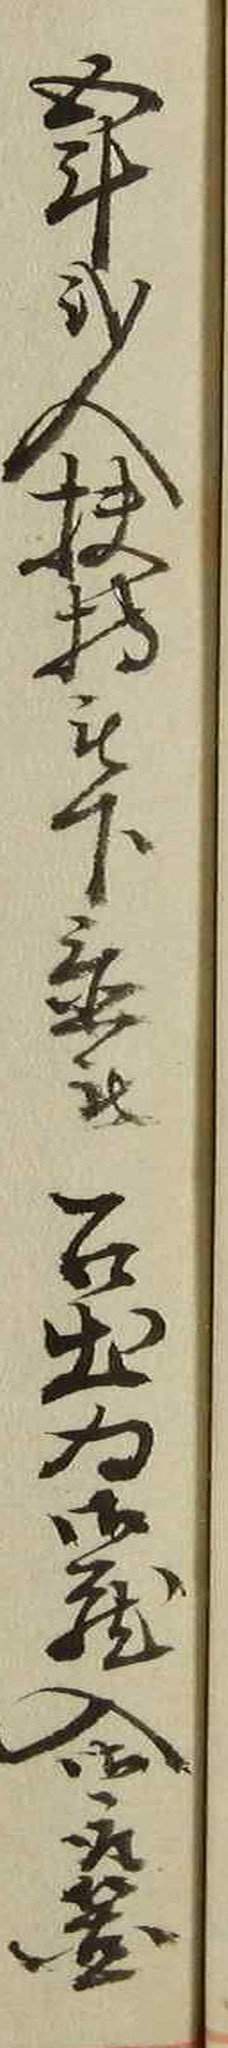五斗弐人扶持被下置被召出為御蔵入御取箇
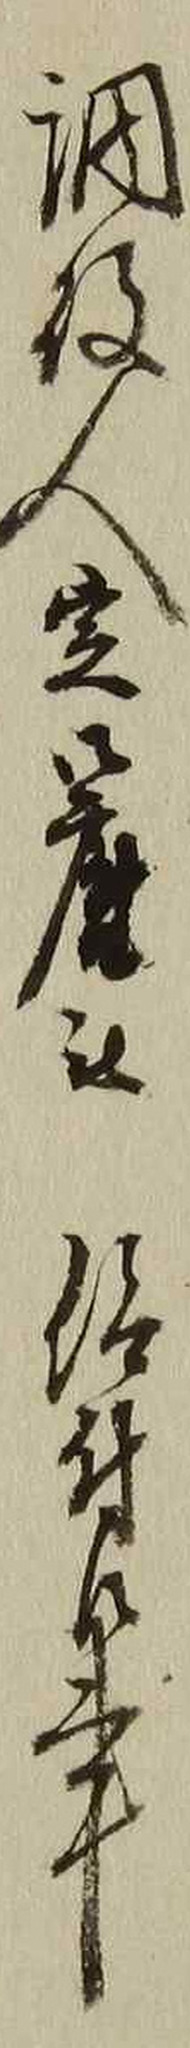調役人定雇被仰付候事
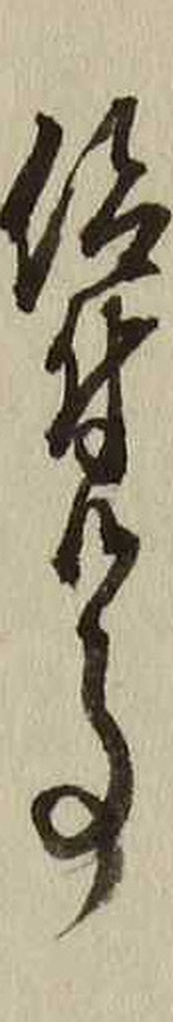仰付候事
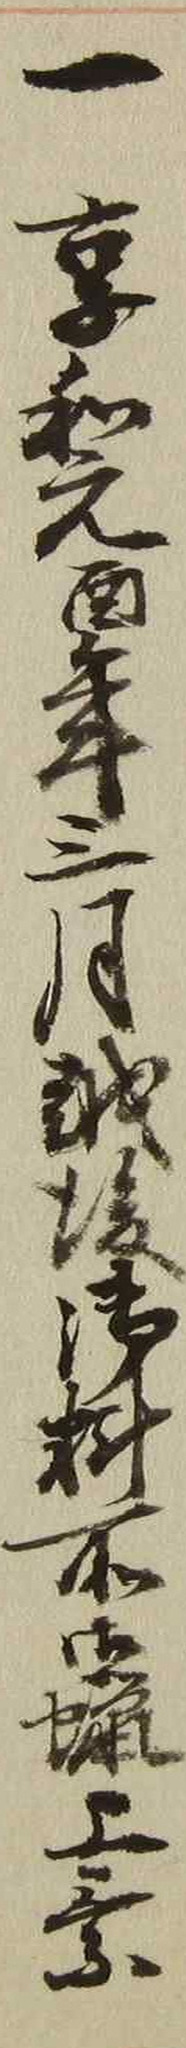一享和元酉年三月越後御料所御蝋上乗
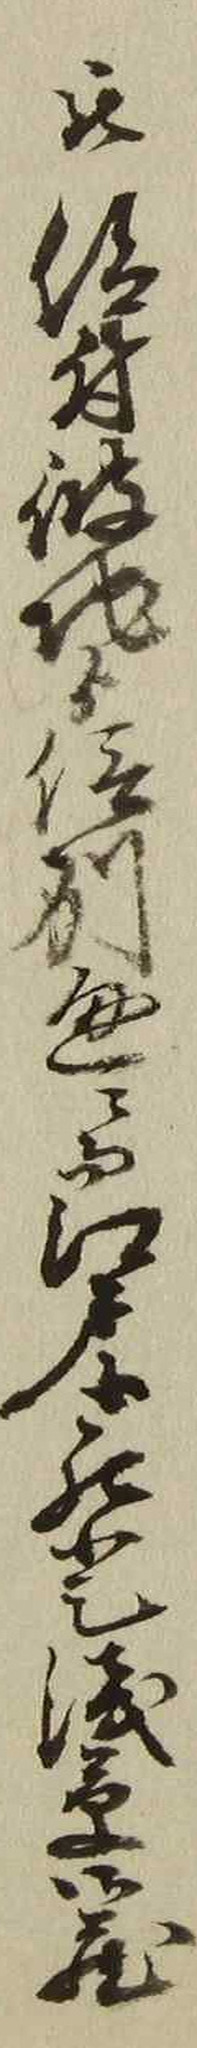被仰付彼地ゟ信州通に而江戸え罷登浅草御蔵
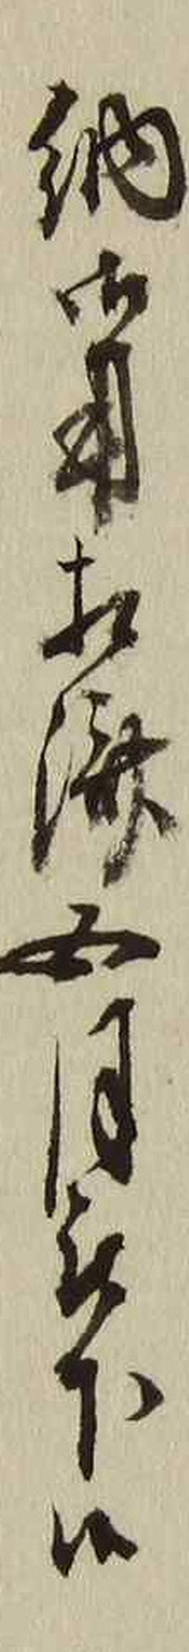納御用相済五月被下候
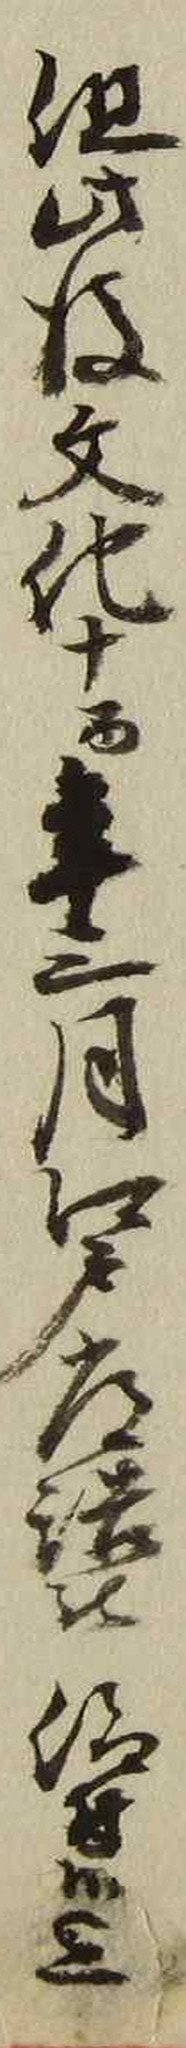但此後文化十酉年三月江戸常詰被仰付候上
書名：諸士系譜　巻之38　は之部6
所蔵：会津若松市立会津図書館
